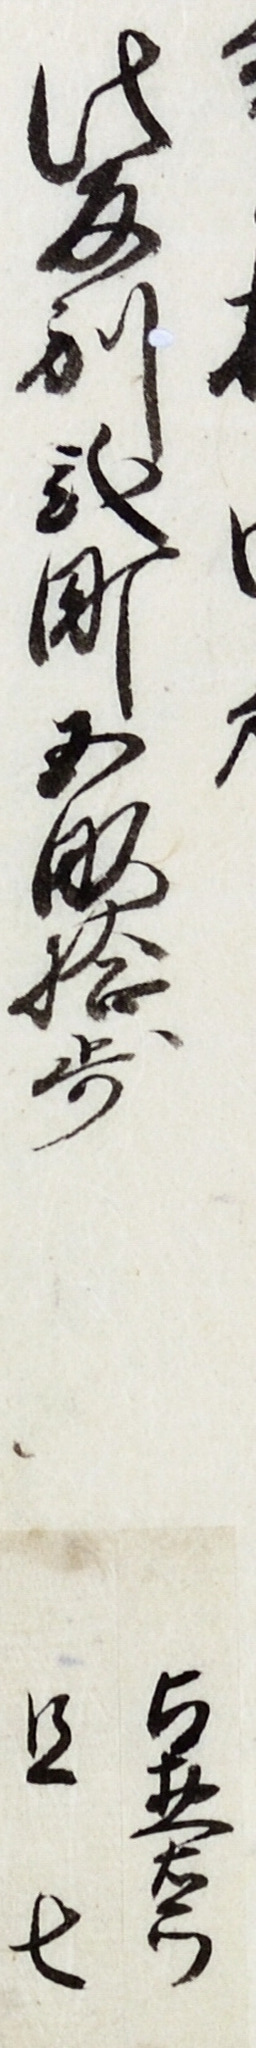此反別弐町五畝拾歩与惣右衛門
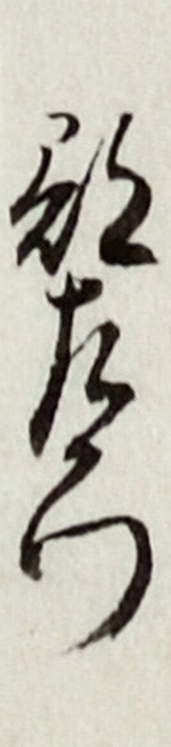郡左衛門
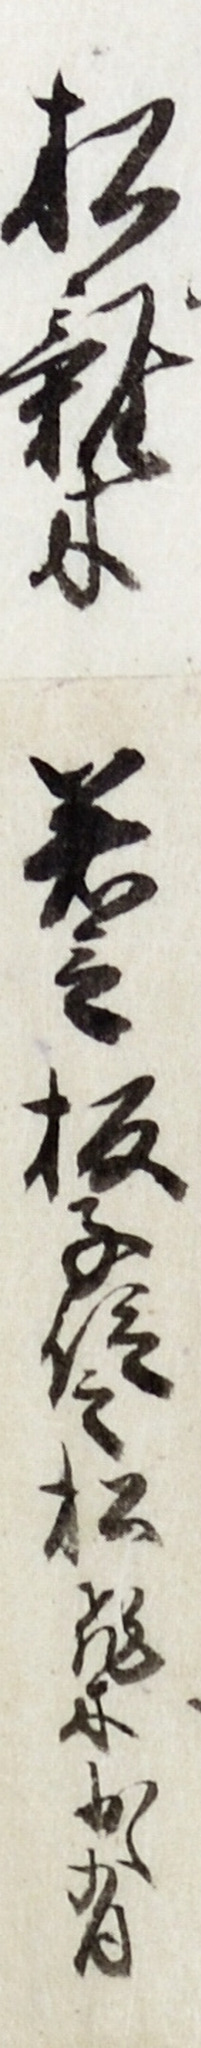松雑木若立板子位之松飛木少々有要助
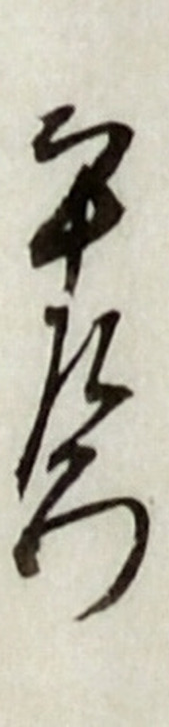郡左衛門
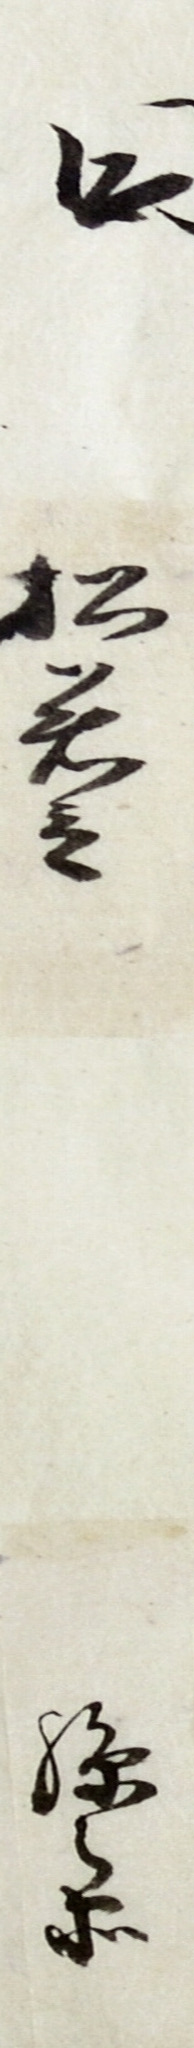同松若立孫兵衛
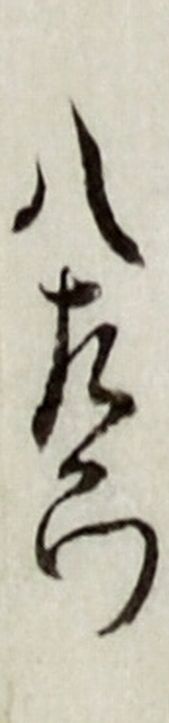八左衛門
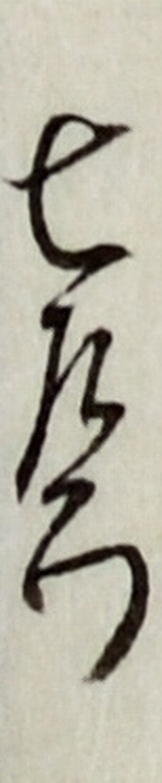七左衛門

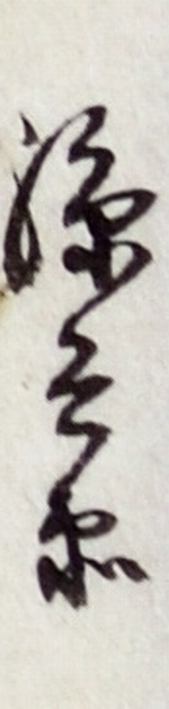孫兵衛
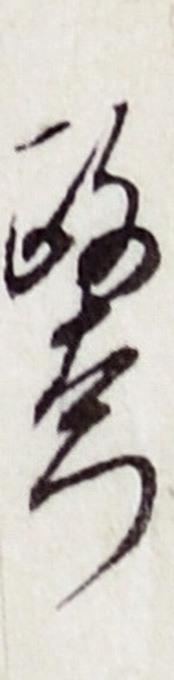政右衛門
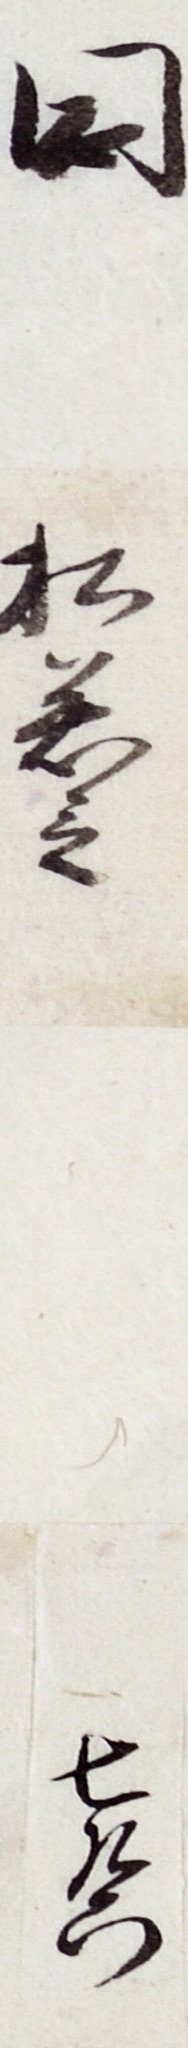同松若立七左衛門
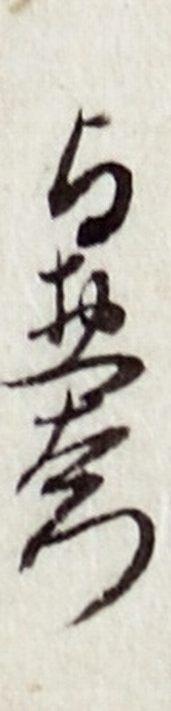与惣右衛門
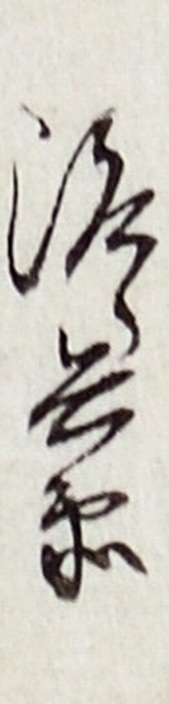孫兵衛
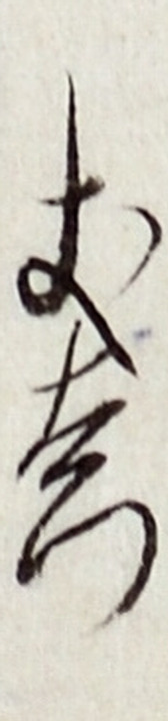丈右衛門
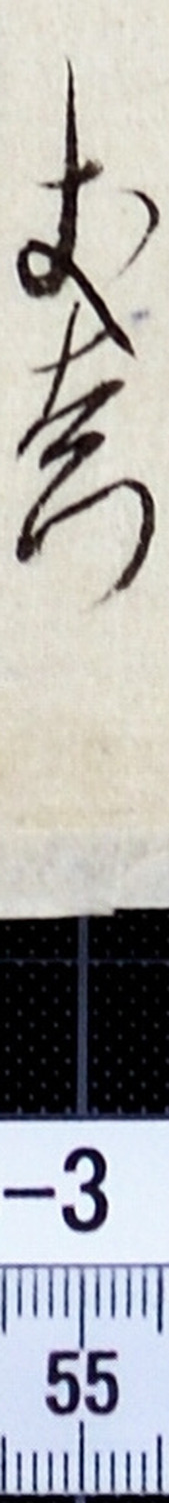丈右衛門
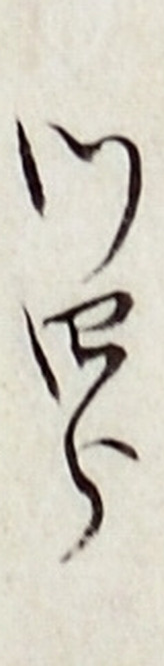門四郎
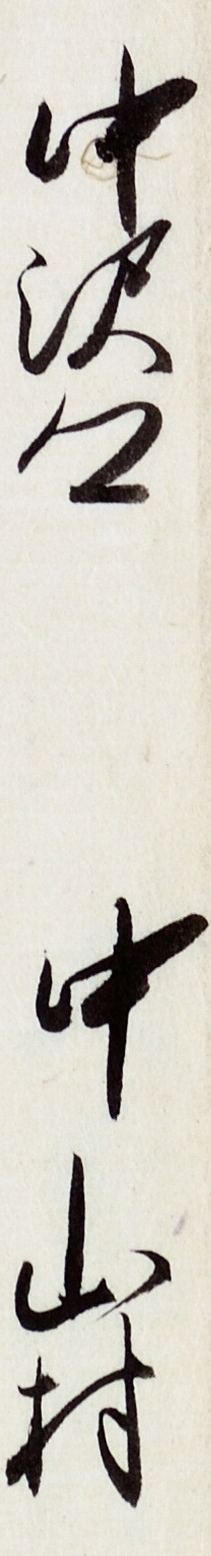中沢郷中山村
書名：御領分中御林御藪附帳
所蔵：伊那市立高遠町図書館・合同会社AMANE
